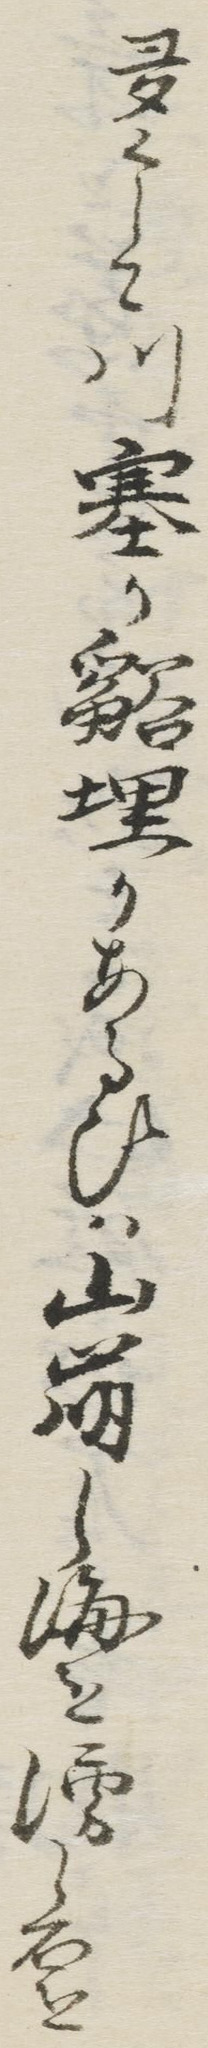多くして川塞り谿埋りあるひハ山崩し海を湧し石を
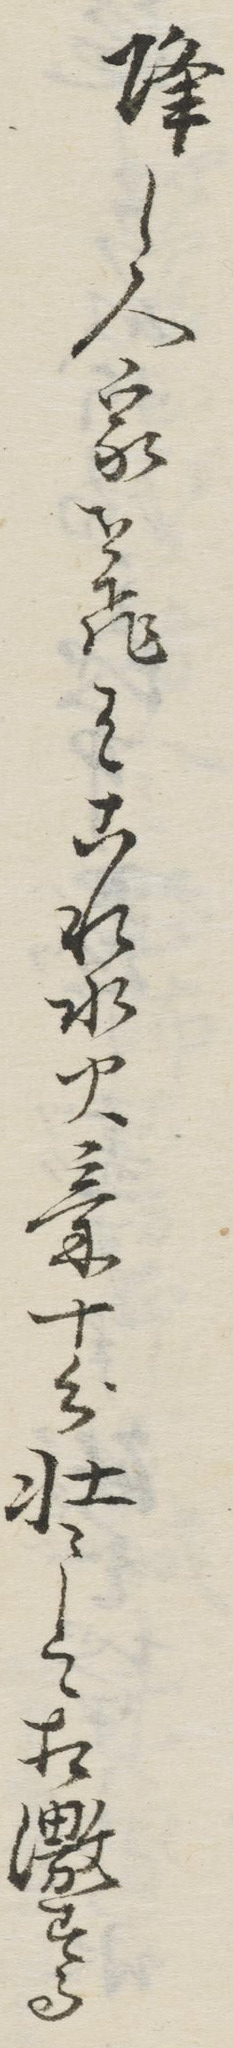降し人家を飛すこれ水火気十分壮ニして相激する
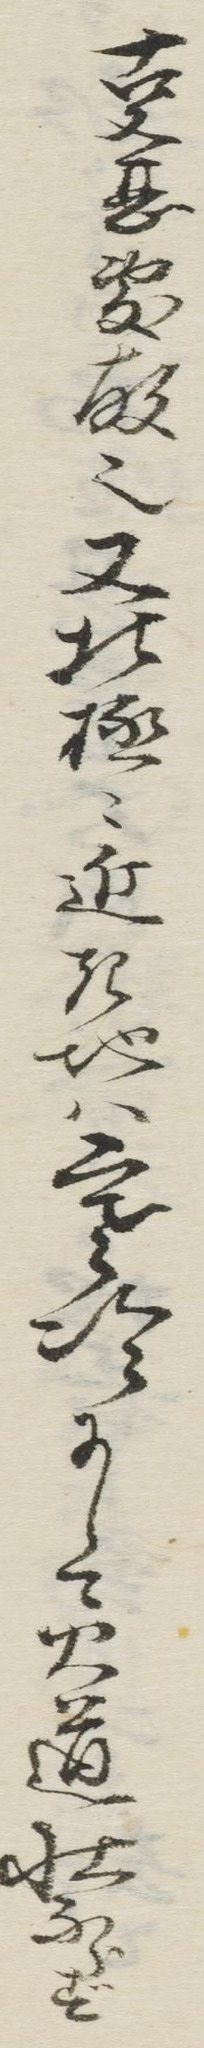事甚敷故也又北極ニ近き地ハ寒冷にして火道壮ならず
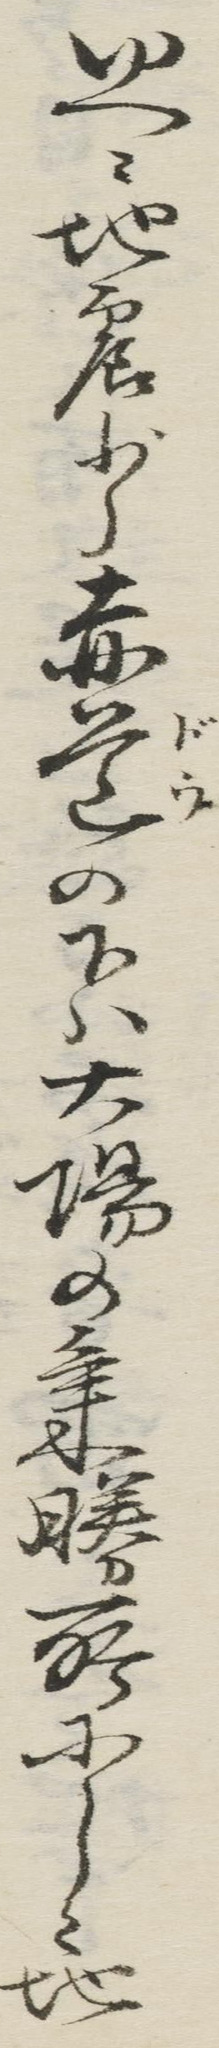ゆへニ地震少し赤道ノ下ハ太陽の気勝所にして地
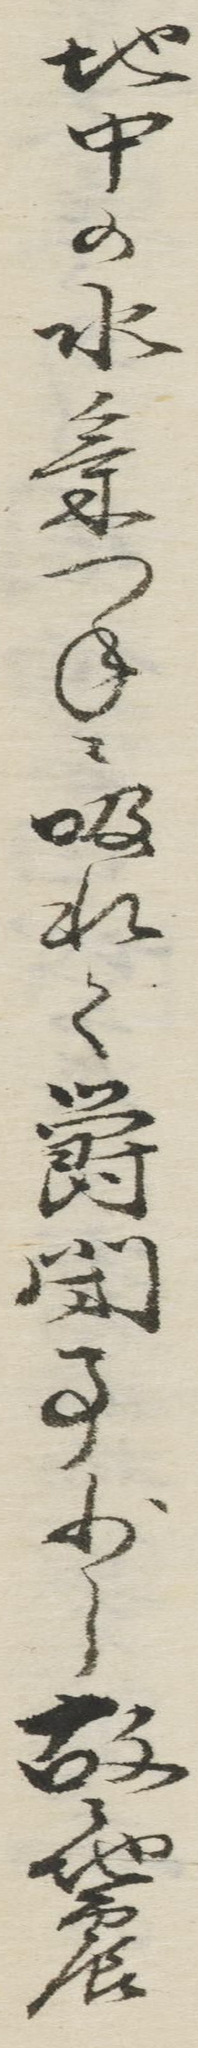地中の水気つねニ吸れて爵閉事少し故ニ地震之

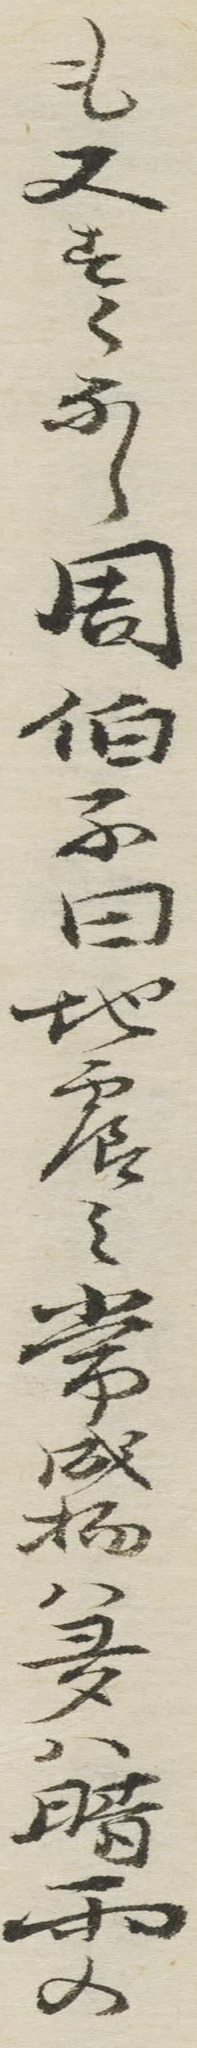も又すくなし周伯子曰地震之常成物ハ多ハ暗雨の
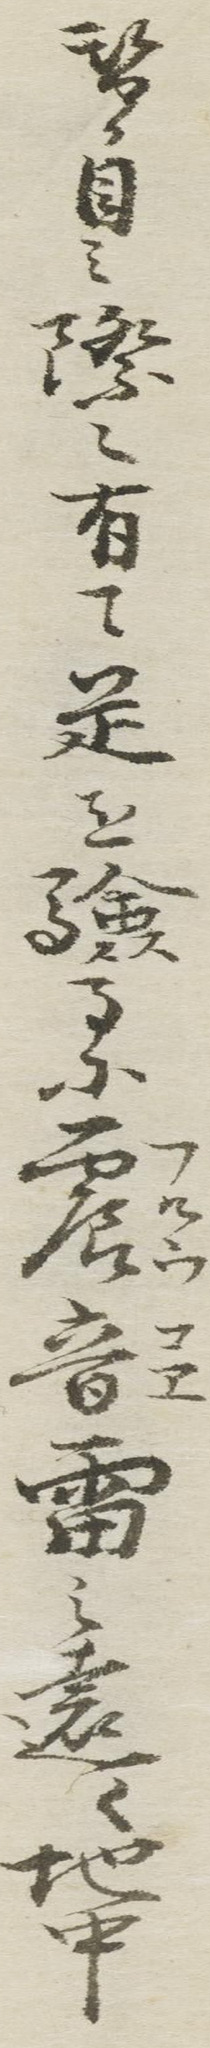替り目之際ニ有て是を験るに震声雷之遠く地中
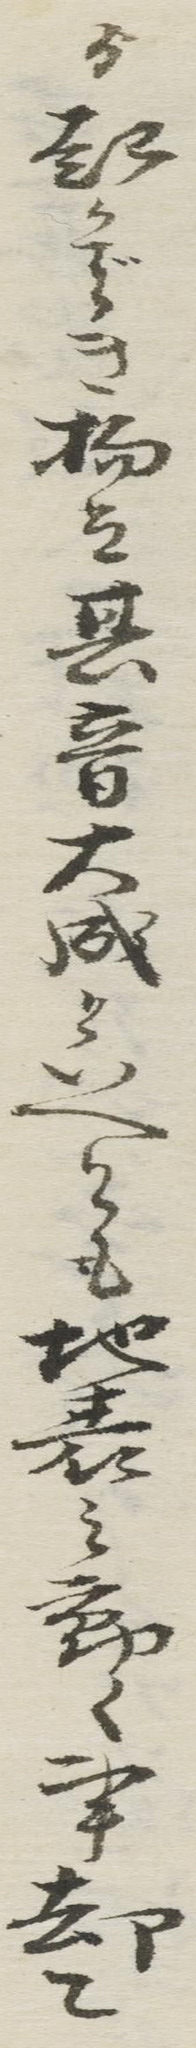ゟ起かずらき物は其音大成といへとも地表之動く事却て
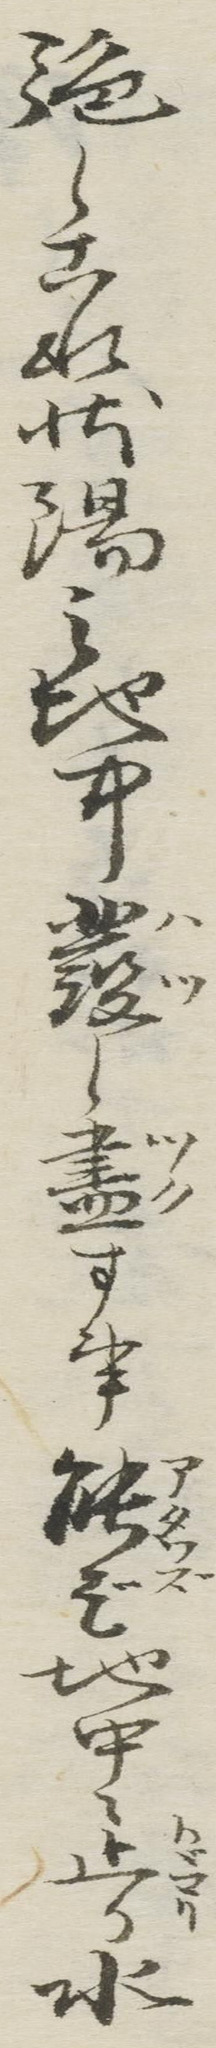絶しこれ状陽之地中発し盡す事能ぞ地中ニ止り水
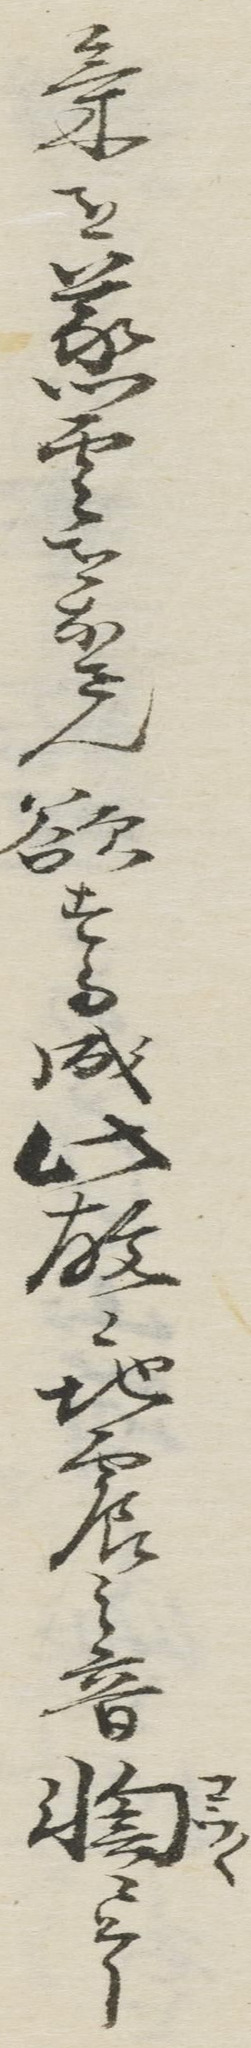気を蒸雲をなさん欲する成此故ニ地震の音輷々とし
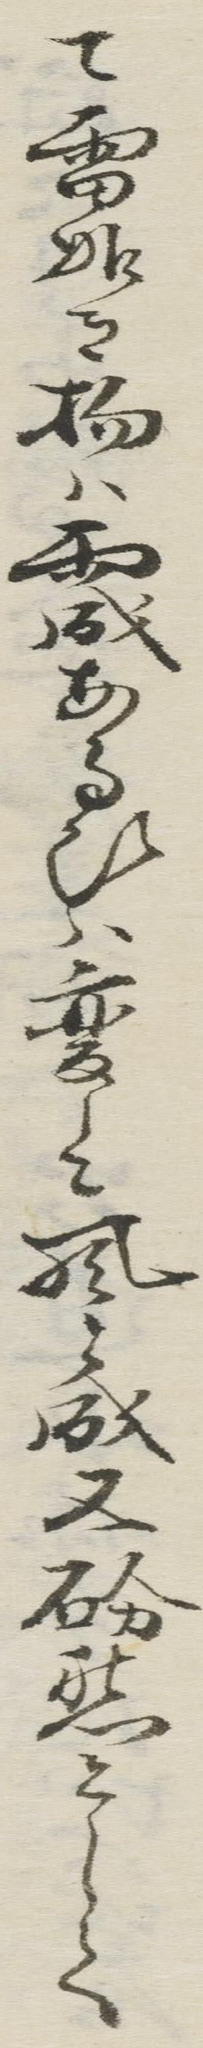て雷如き物ハ雨成あるひハ変じて風ニ成又紛然として
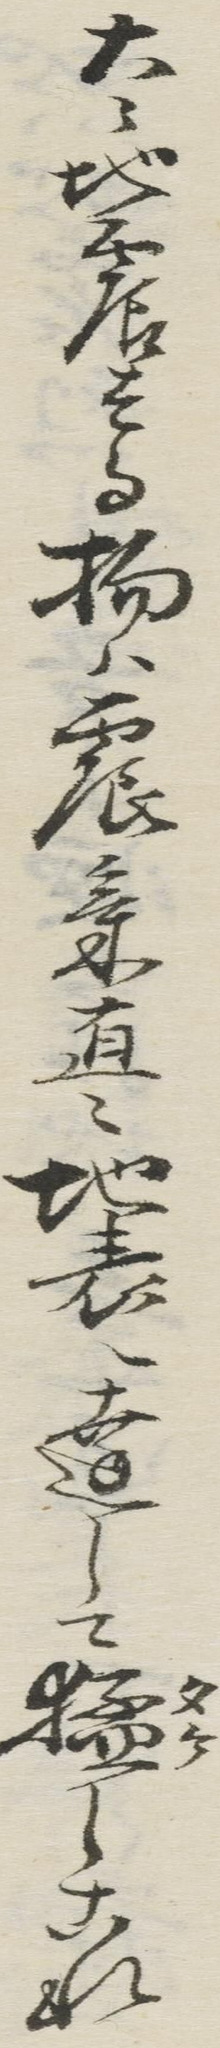大ニ地震する物ハ震キ直ニ地表へ達して猛しこれ
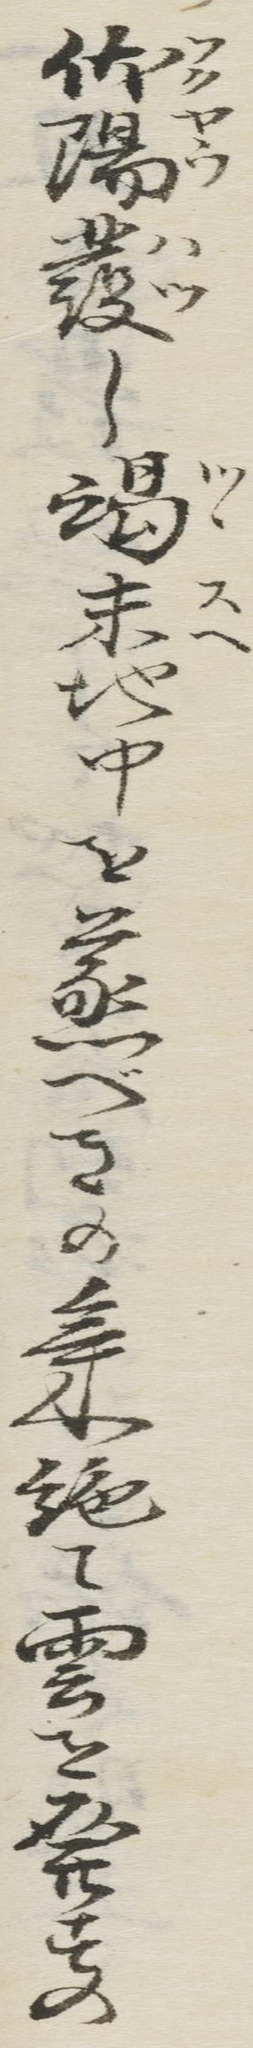伏陽発し竭末地中を蒸べきの気絶て雲を発すの
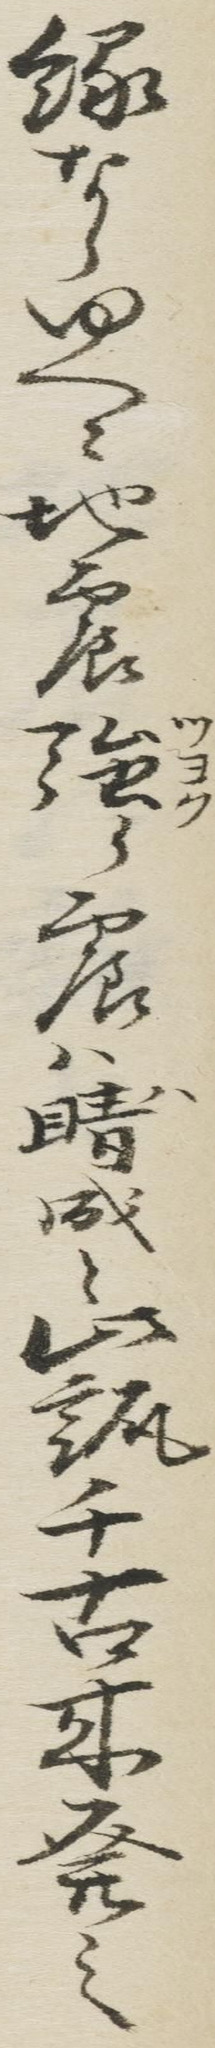縁なりゆへニ地震強ク震ハ晴成と此趣千古来発之
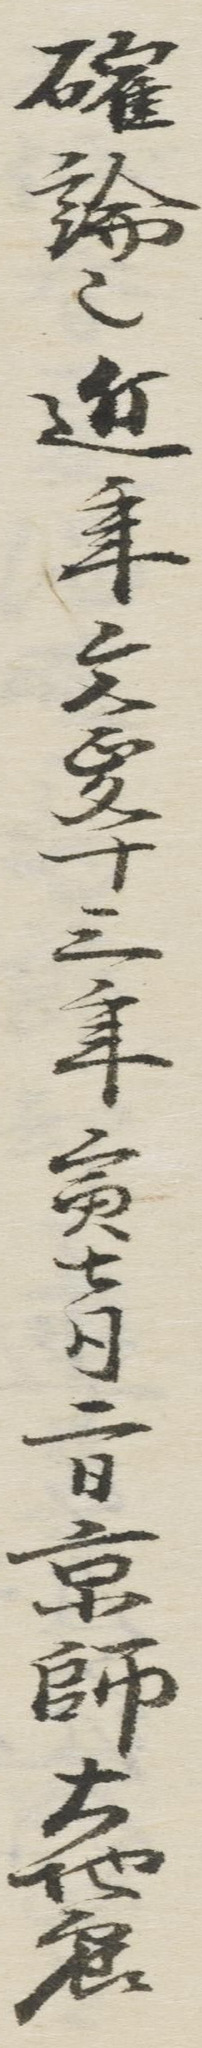確論也近年文政十三年寅七月二日京師大地震
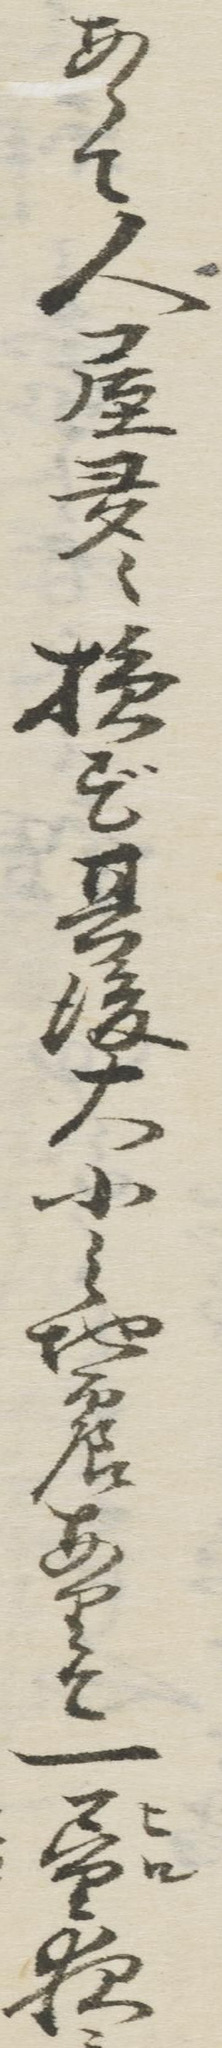ありて人屋多々損ず其後大小之地震ありて一昼夜ニ
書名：諸国大地震大津波一代記
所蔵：東京大学地震研究所図書室 Earthquake Research Institute Library, The University of Tokyo, JAPAN
